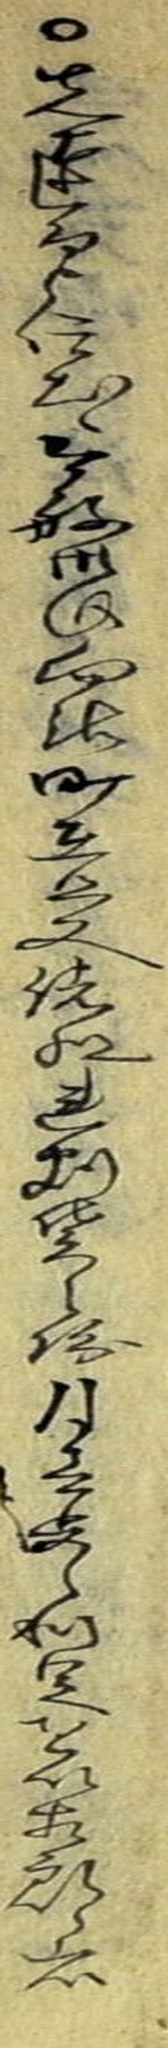〇先達而被仰出候今般御趣向銀町在且又諸組連判貸之儀月壱歩之利足を以相願候者
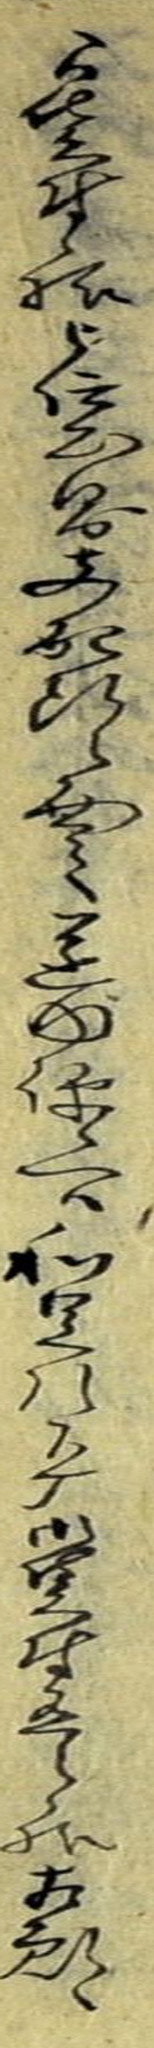へ御貸付候様被仰出則支配頭之面々へ遂内許候ヘハ利足引下ケ御貸付有之候様相願候
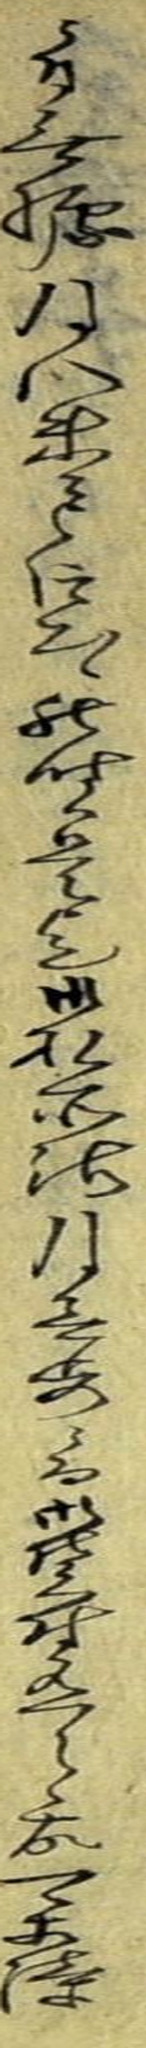ニ付無拠月八朱ニ被仰出候然時ハ是迄御札所銀月壱歩ニ而御貸付有之候故可相障
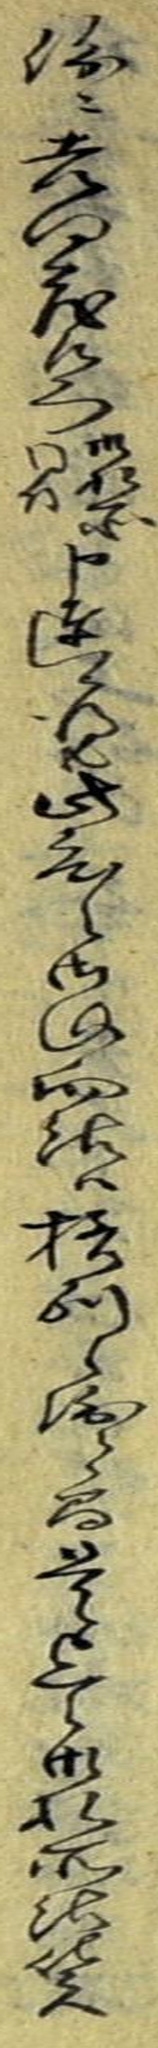目付申達候得共此度之御趣向銀ハ格別之儀ニ候間是迄之御札所銀貸

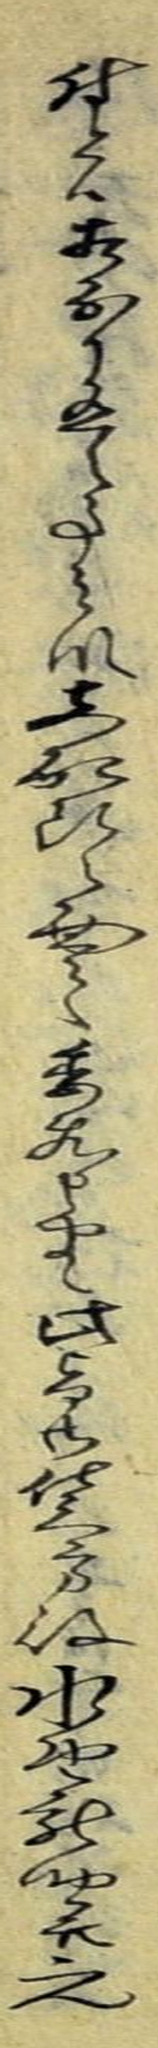付とハ相分り有之事ニ候段支配頭之面々へ委敷申聞候此旨御貸方役水野新助并元
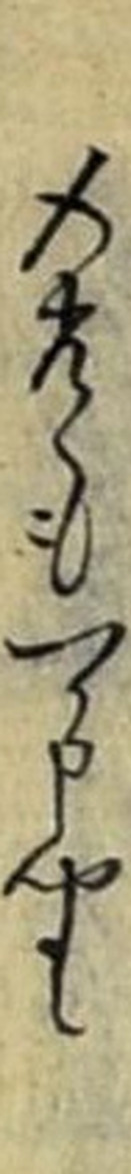〆共へも可申聞候
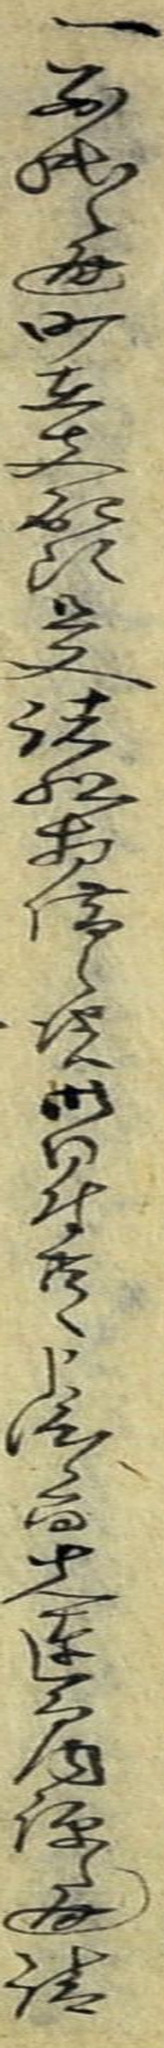一別紙之通町在支配頭且又諸組拝借之儀ハ御目付共へ申渡候間先達而内許之通請
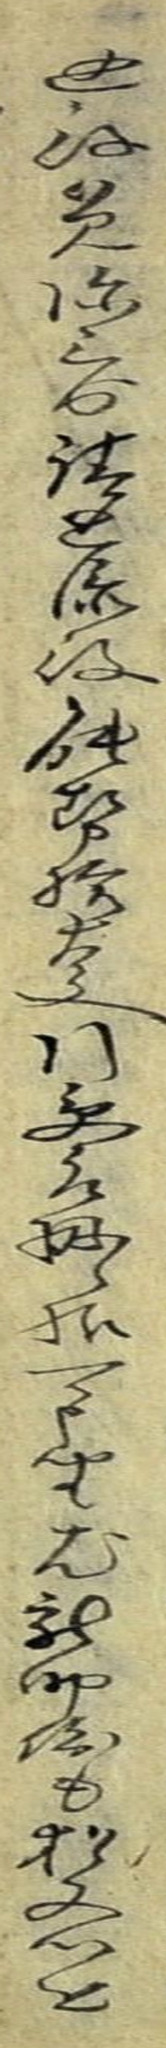込役筧弥三右衛門請込添役能勢拾大夫引受取扱候様可申聞候尤新助儀も猶又心を
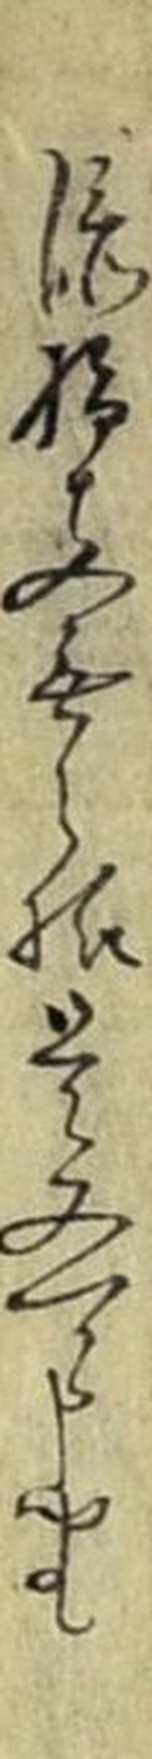添指支無之様是又可申聞候
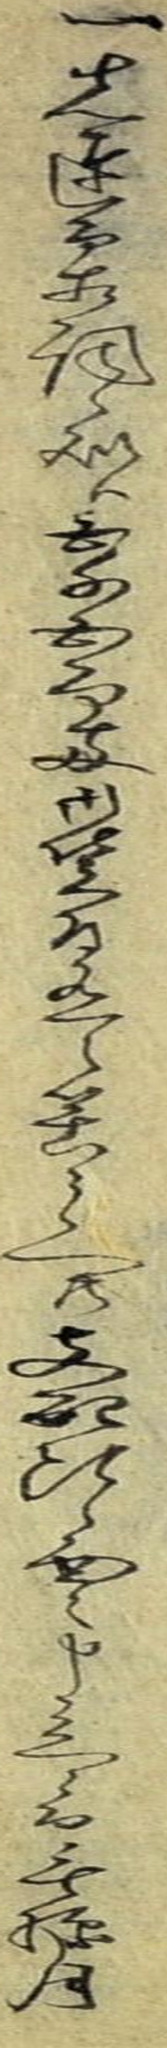一先達而相調候処ハ五千五百両御貸付有之筈ニ候へ共支配頭之面々申立ニ而無拠月
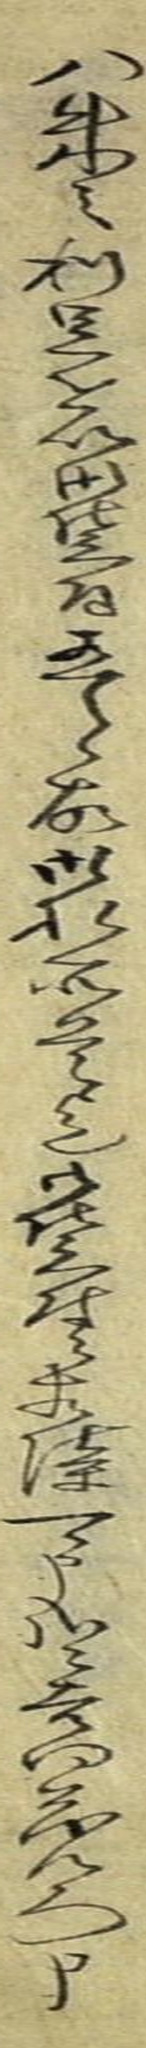八朱之利足を以御貸付有之候故御札所是迄御貸付ニ相障可申哉ニ吉田茂左衛門申
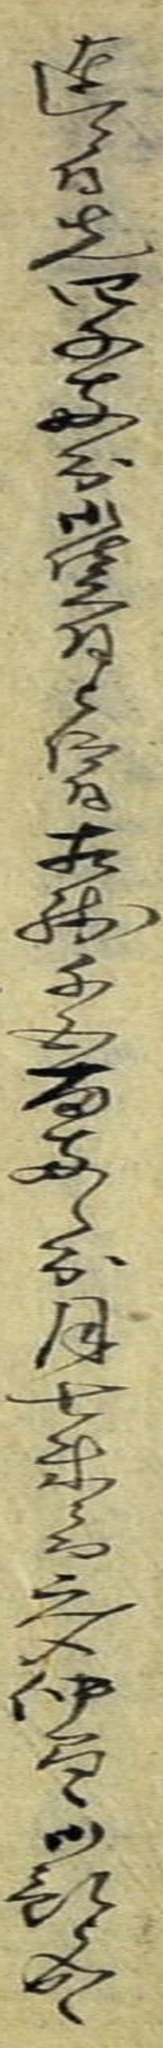達候ニ付先四千両分御貸付被仰付相残千五百両之分月七朱ニ而元〆仲間へ御預被成候
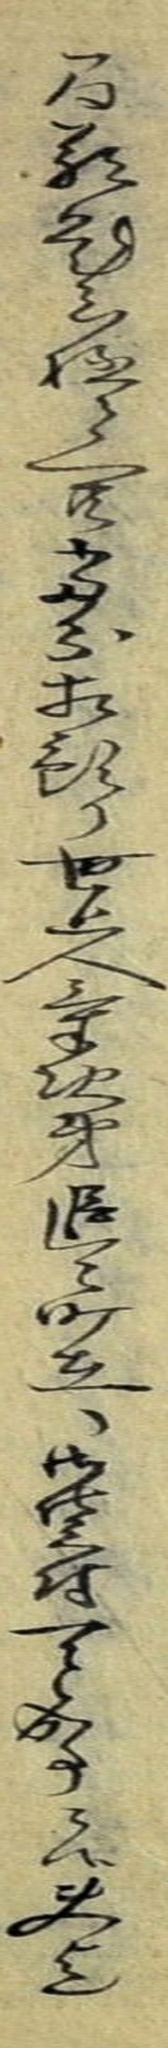間難題至極ニ候へ共当分相預り世上人気次第追々町在へ御貸付可被成事ニ候夫迄
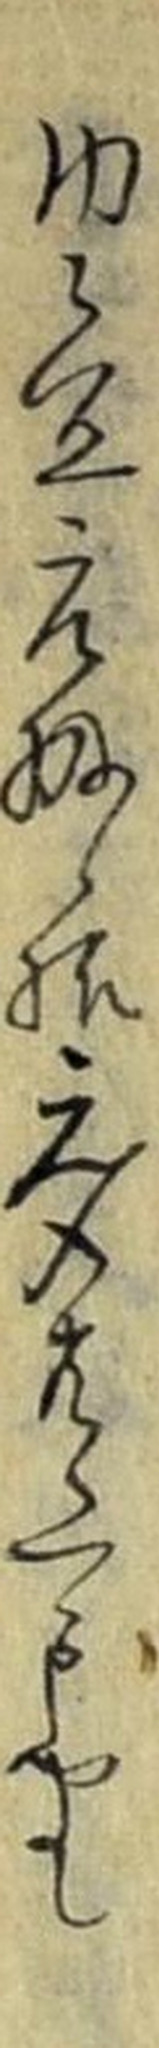内々宜取扱候様元〆共へ可申聞候
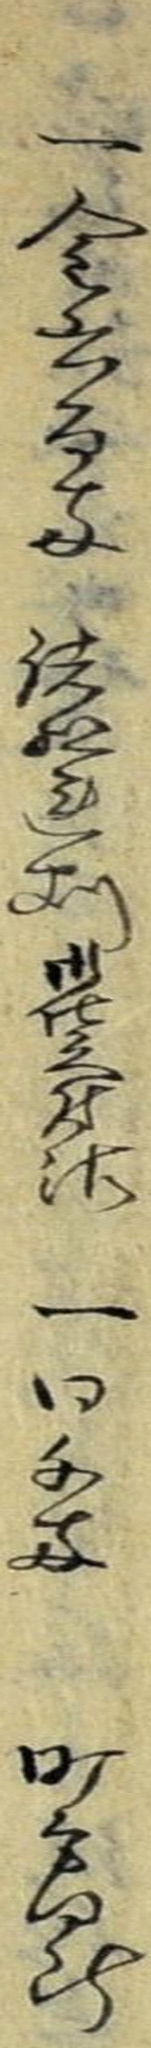一金六百両諸組連判御貸銀一同千両町方同断
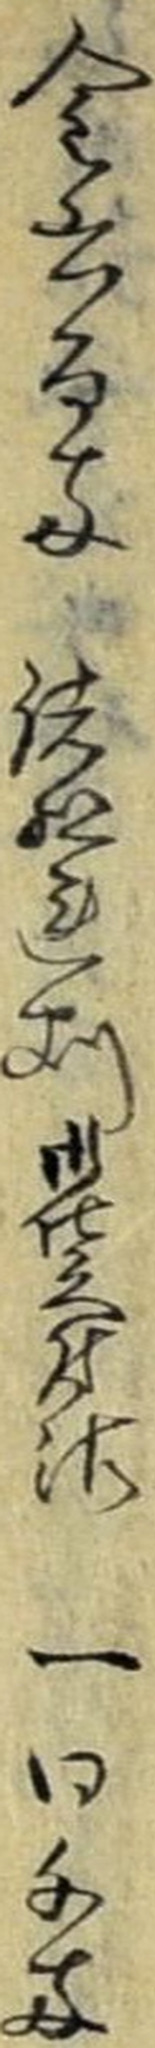一金六百両諸組連判御貸銀一同千両町方同断
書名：命令之部 三
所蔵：福井県文書館 Fukui Prefectural Archives
